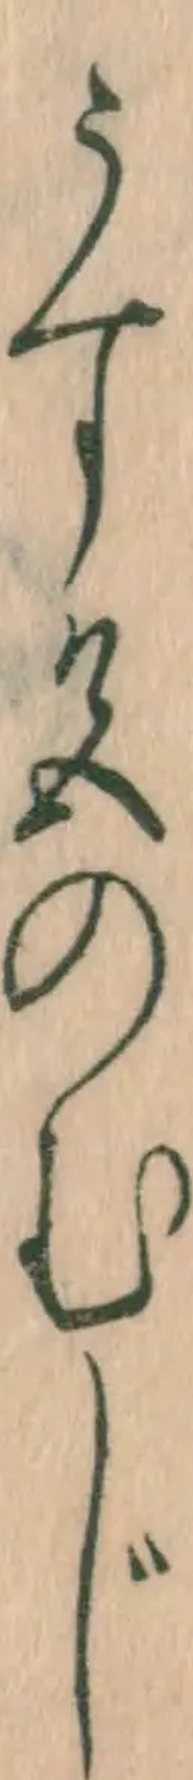うす色のむじ
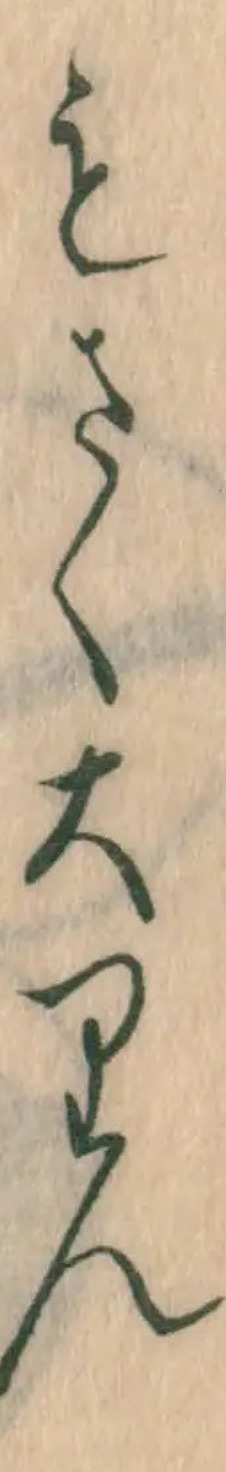もさく大りん
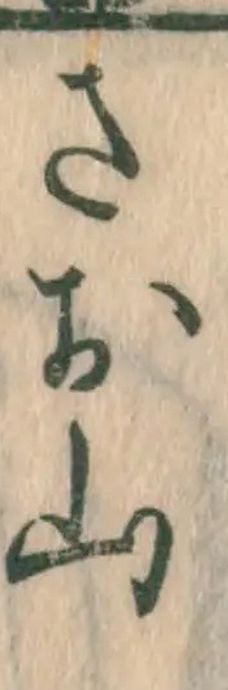さお山
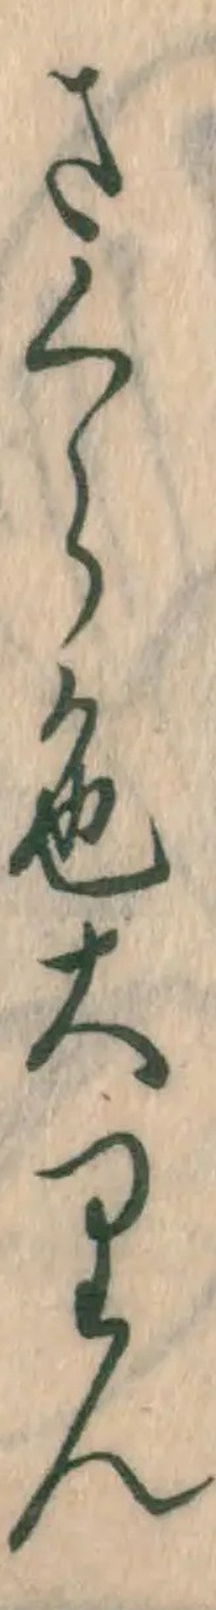さくら色大りん
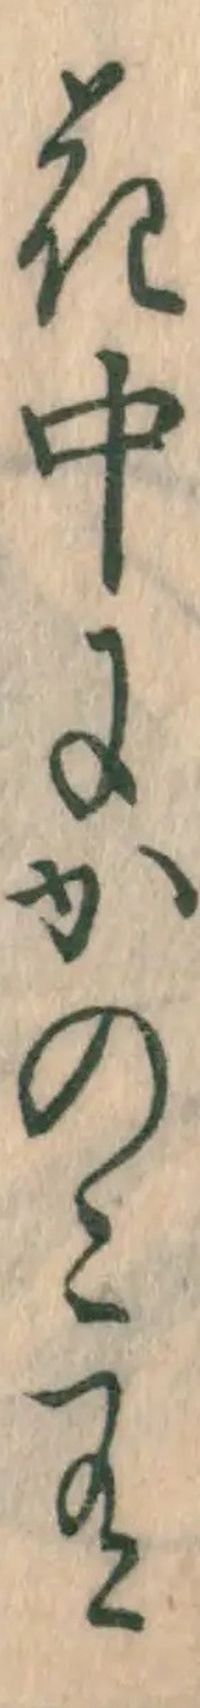花中にかのこ有

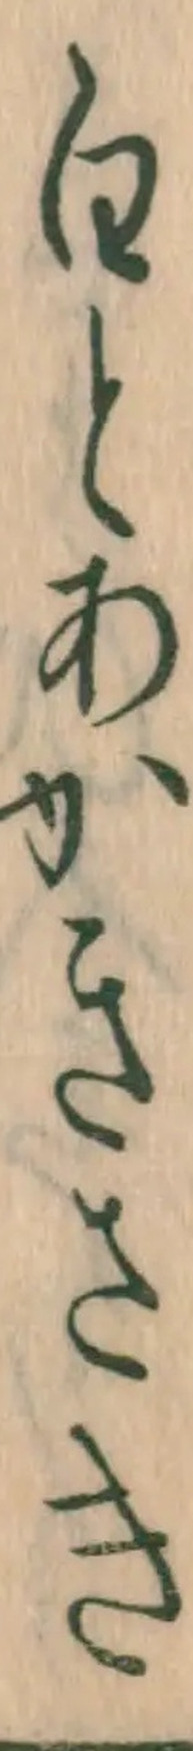白とあかきさき
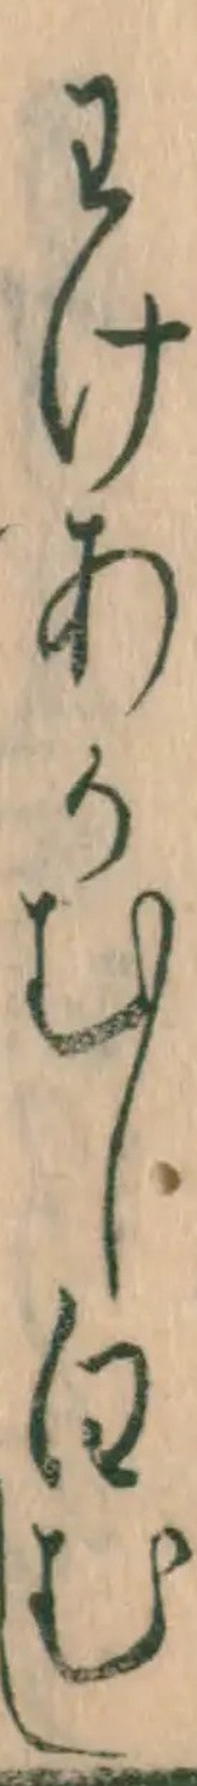わけあかむし白むし
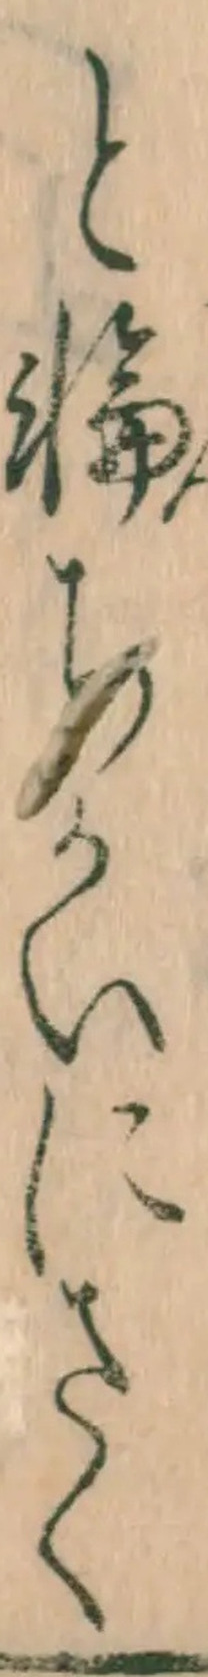と輪ちかいにさく
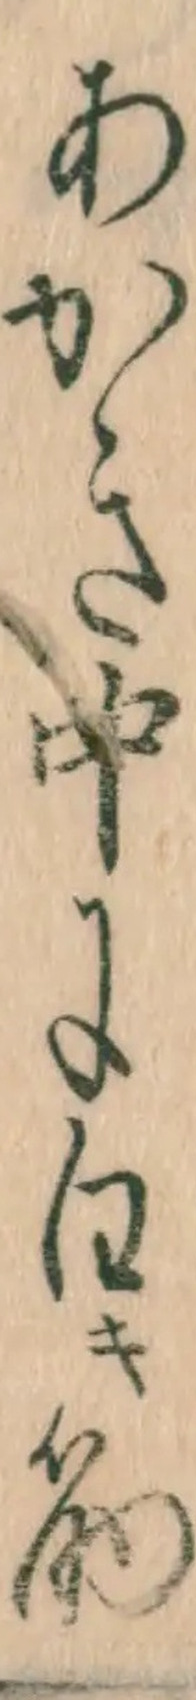あかき中に白筋
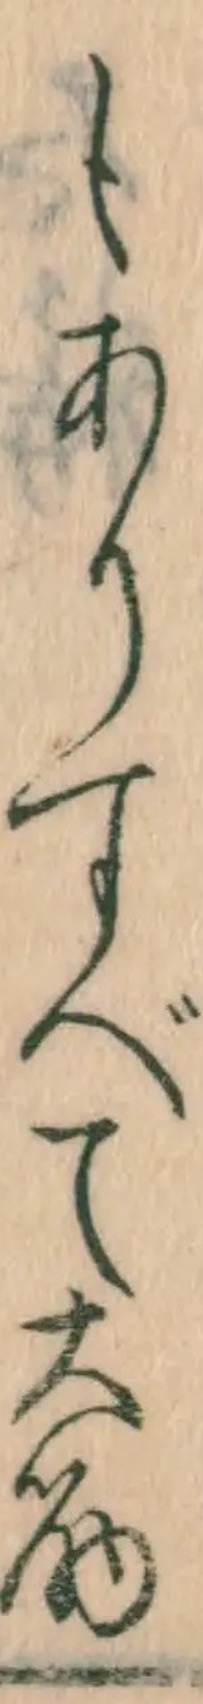もありすべて大筋
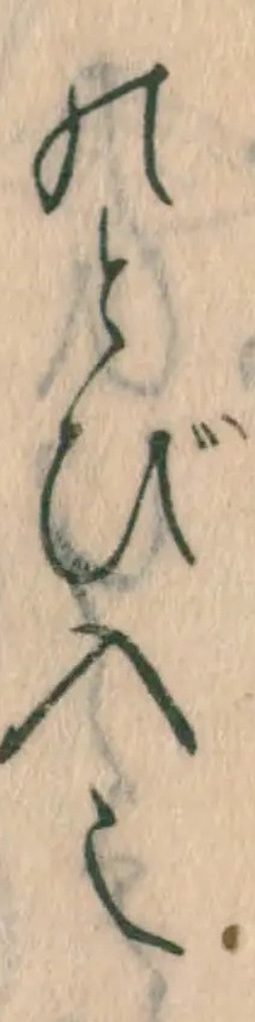のとび入也
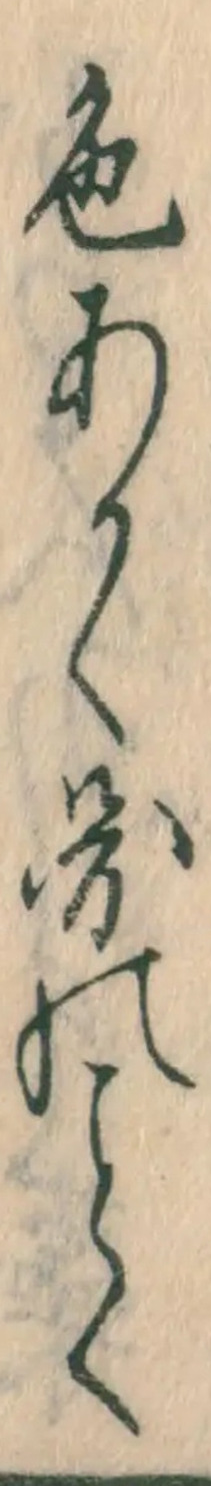色あかく図のことく

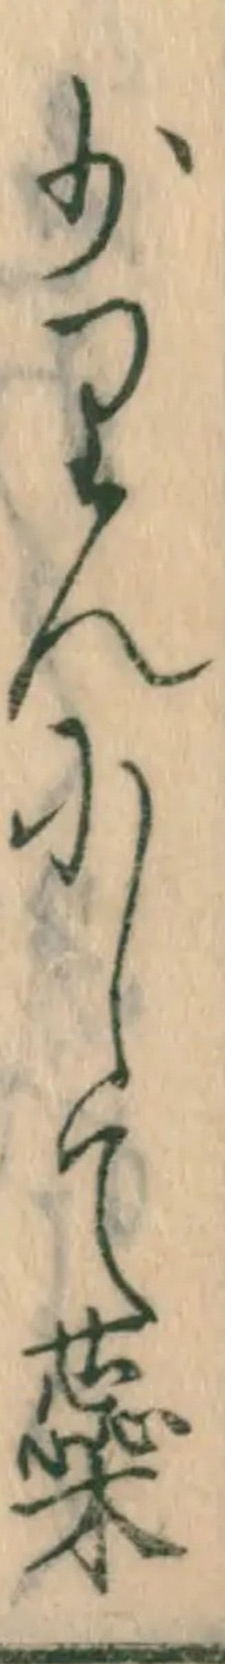少りんにして蘂
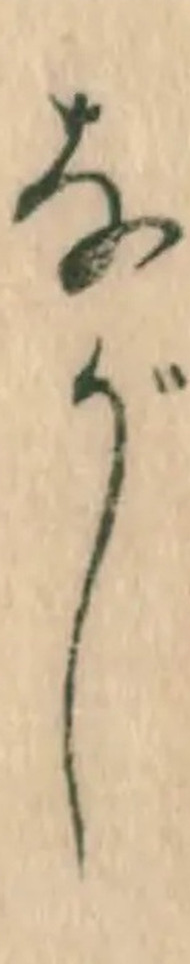ながし
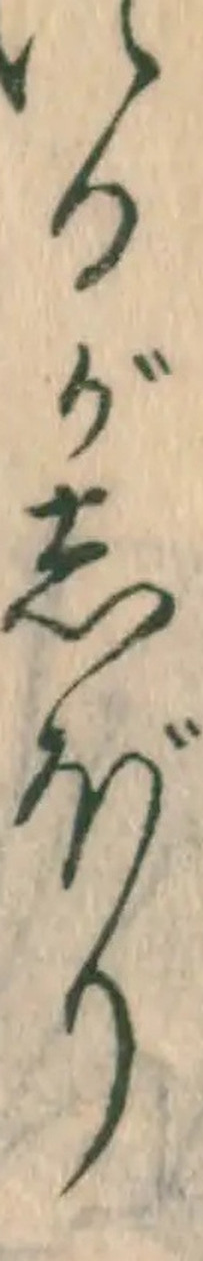●つるがしぼり
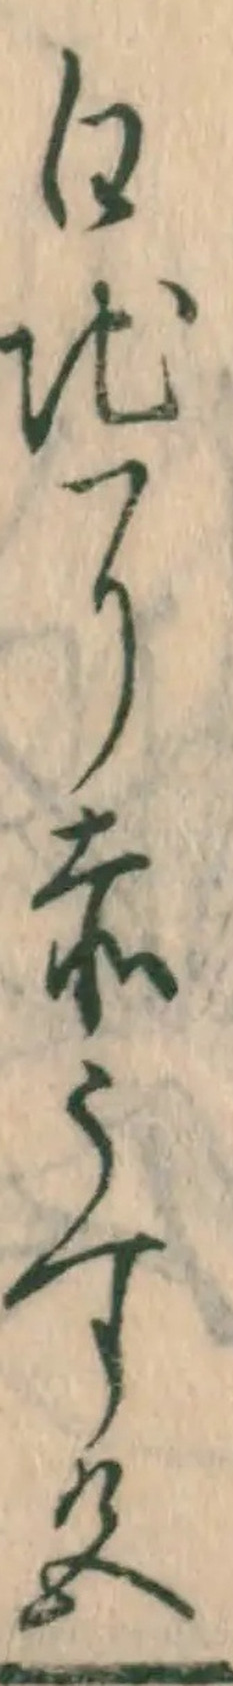白地に赤うす色
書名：錦繍枕 5巻. [4]
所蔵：国立国会図書館 National Diet Library, JAPAN
